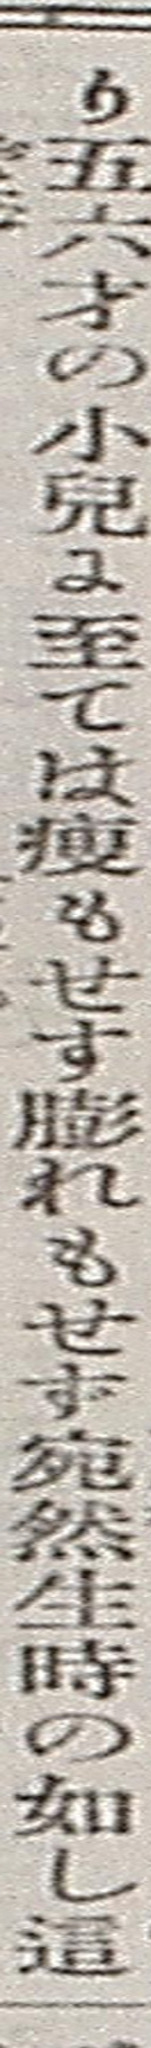り五六才の小兒に至ては痩もせず膨れもせず宛然生時の如し這
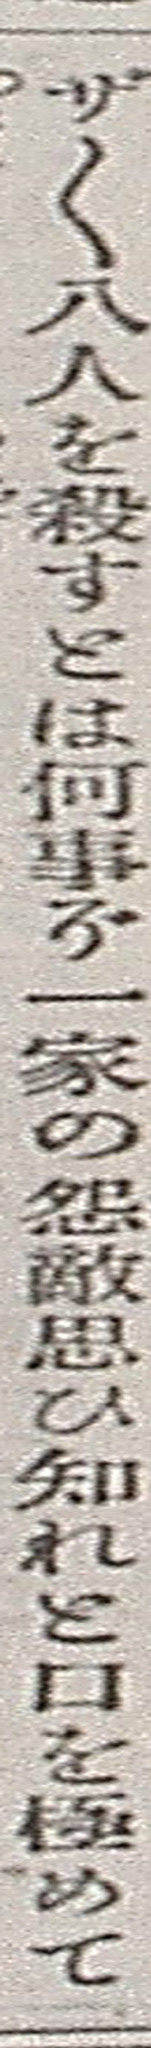ザ〳〵八人を殺すとは何事ぞ一家の怨敵思ひ知れと口を極めて
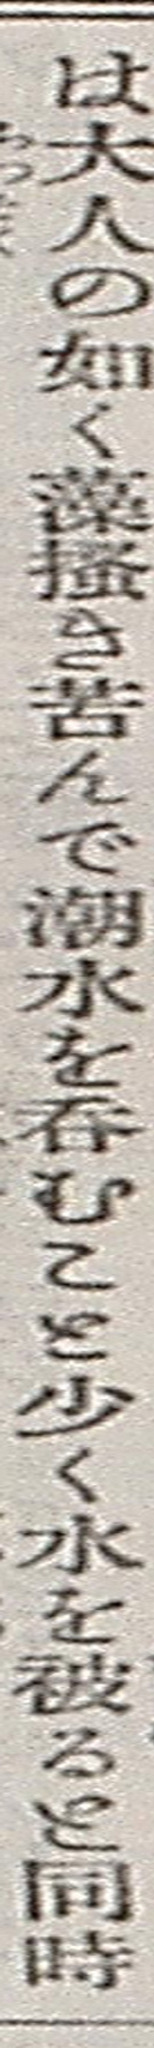は大人の如く藻掻き苦んで潮水を呑むこと少く水を被ると同時
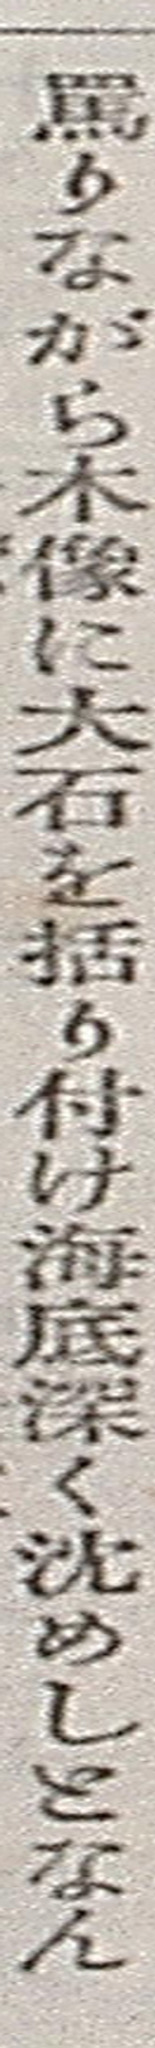罵りながら木像に大石を括り付け海底深く沈めしとなん
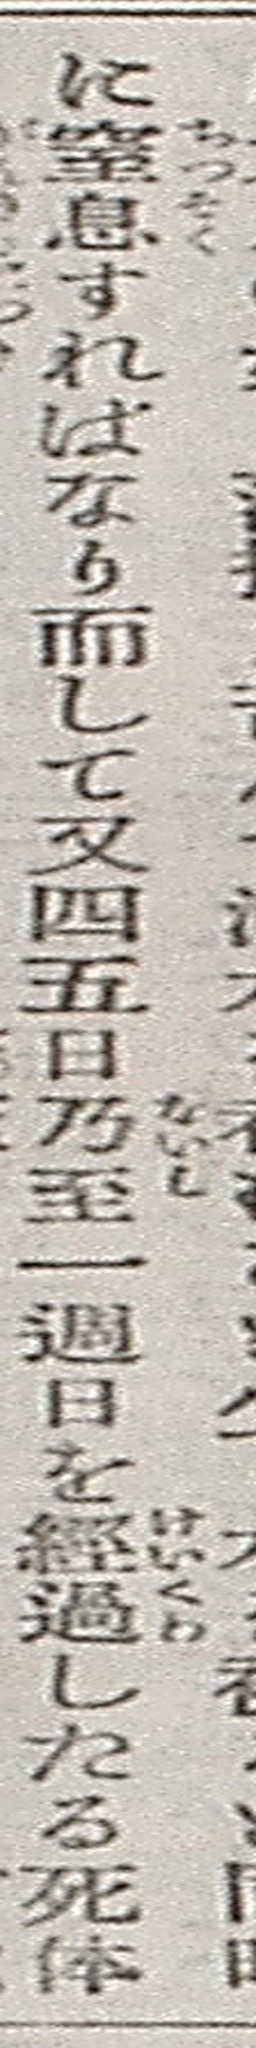に窒息すればなり而して又四五日乃至一週日を経過したる死体
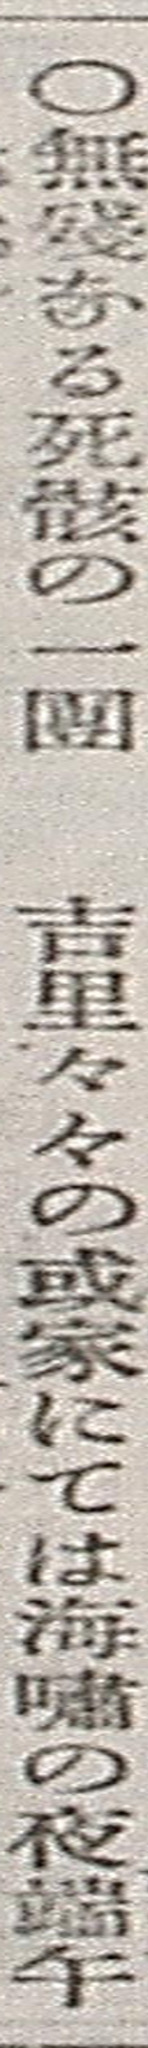○無残なる死骸の一団古里々々の或家にては海嘯の夜端午
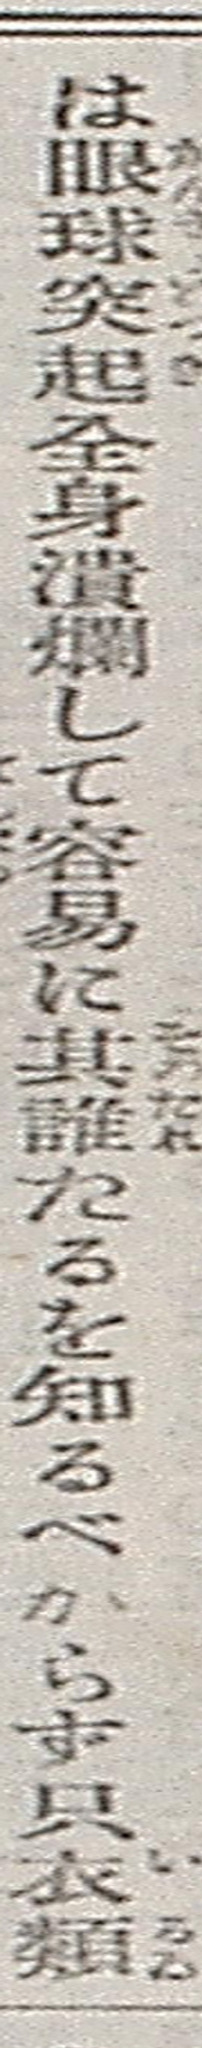は眼球突起全身潰爛して容易に其誰たるを知るべからず只衣類
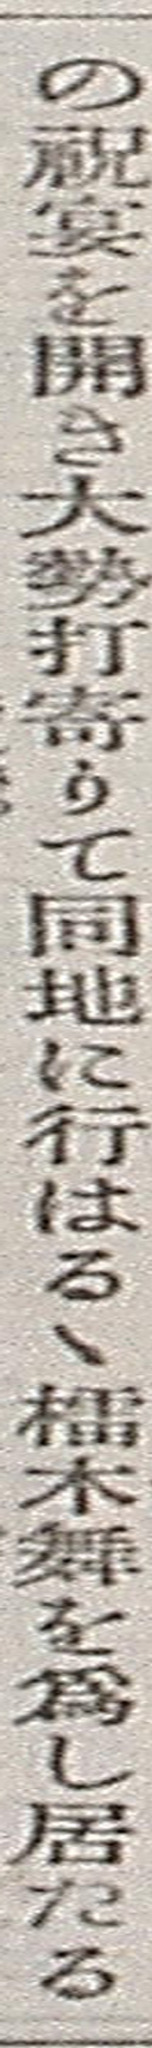の祝宴を開き大勢打寄りて同地に行はるゝ擂木舞を為し居たる
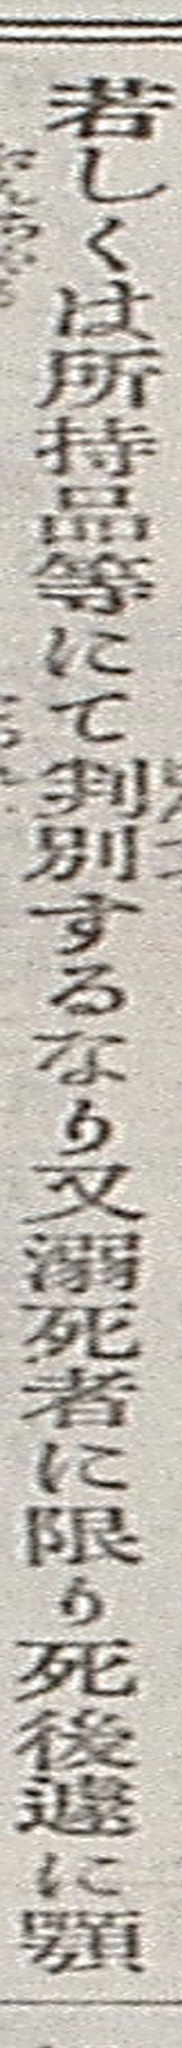若しくは所持品等にて判別するなり又溺死者に限り死後遽に顎
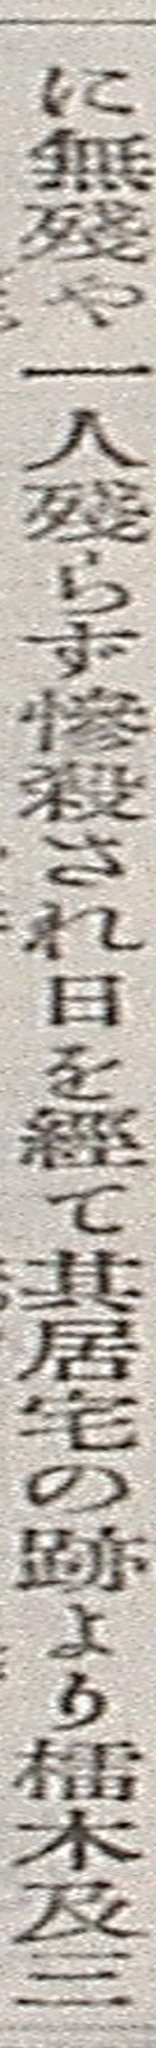に無残や一人残らず惨殺され日を経て其居宅の跡より擂木及三
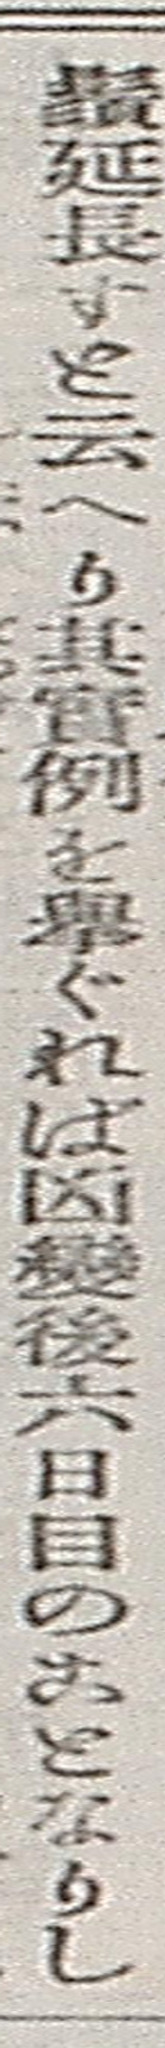鬚延長すと云へり其実例を挙ぐれば凶変後六日目のことなりし
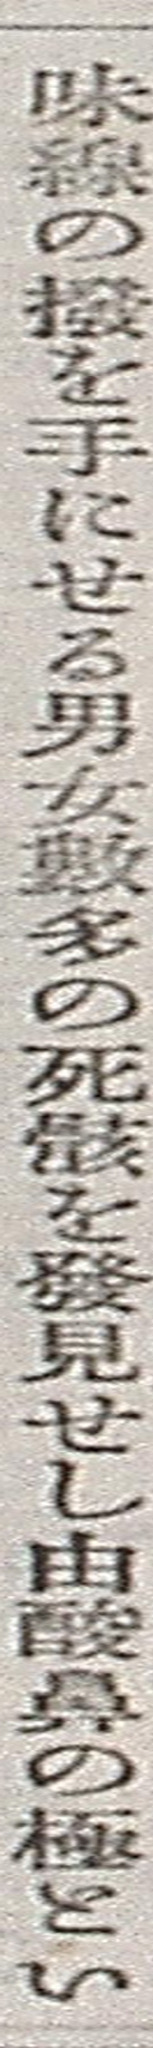味線の撥を手にせる男女数多の死骸を発見せし由酸鼻の極とい
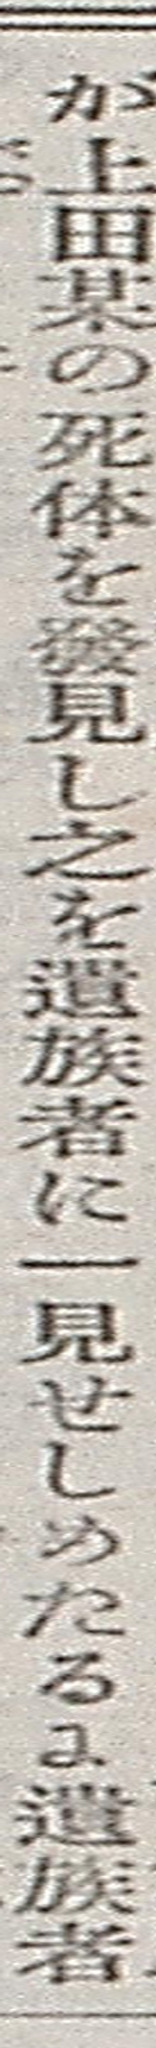が上田某の死体を発見し之を遺族者に一見せしめたるに遺族者
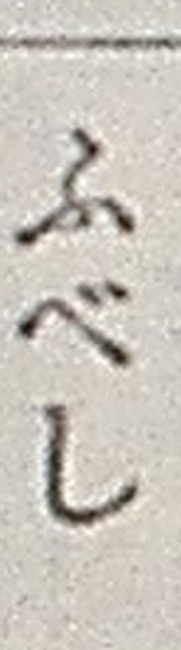ふべし
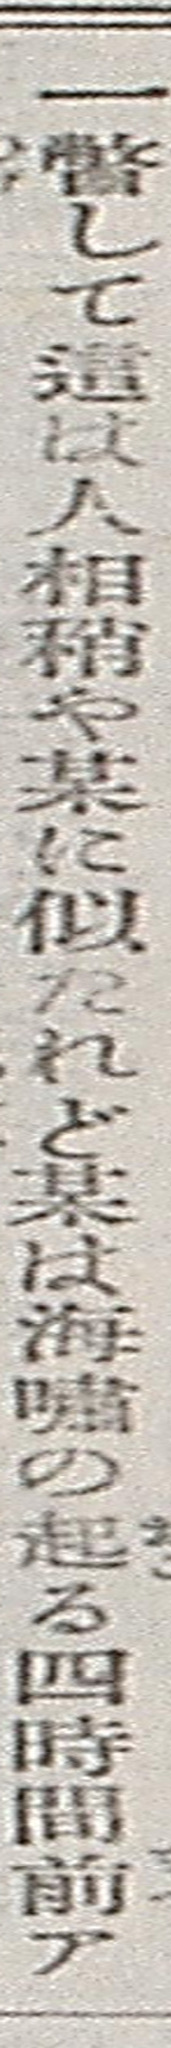一瞥して這は人相稍や某に似たれど某は海嘯の起る四時間前ア
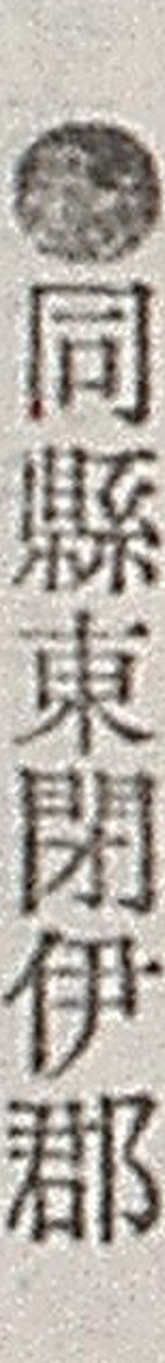●同県東閉伊郡
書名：風俗畫報臨時増刊第百二十號　大海嘯被害録（下）
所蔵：東京大学地震研究所図書室 Earthquake Research Institute Library, The University of Tokyo, JAPAN
